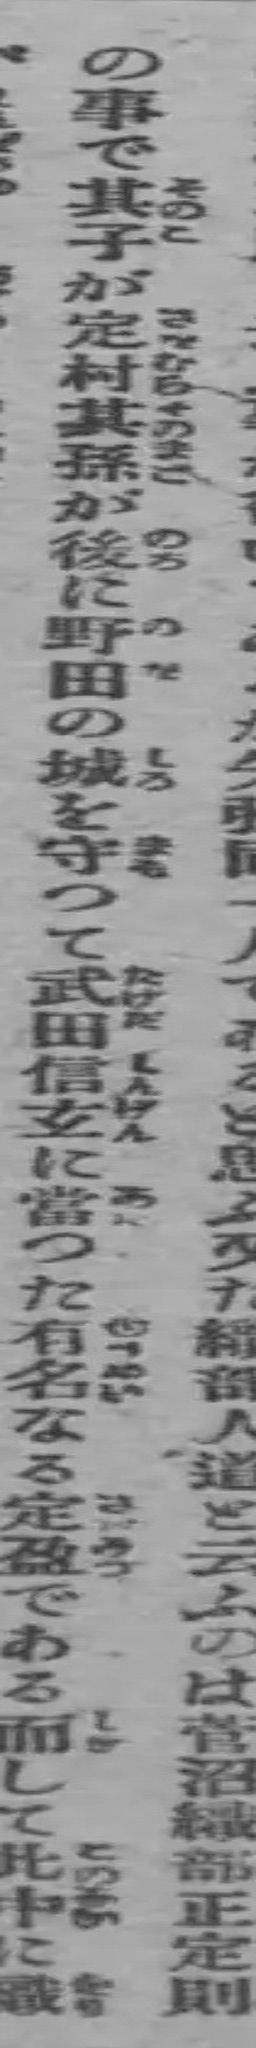菅沼織部正の事で其子が定村其孫が後に野田の城を守つて武田信玄に当つた有名なる定盈である而して此中に織
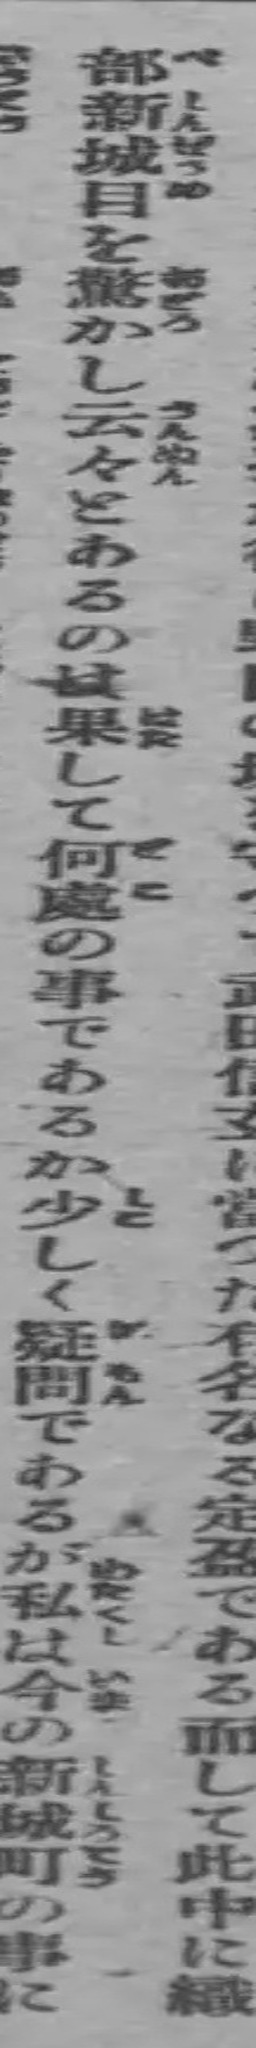部新城目を驚かし云々とあるのは果して何処の事であるか少しく疑問であるが私は今の新城町の事に
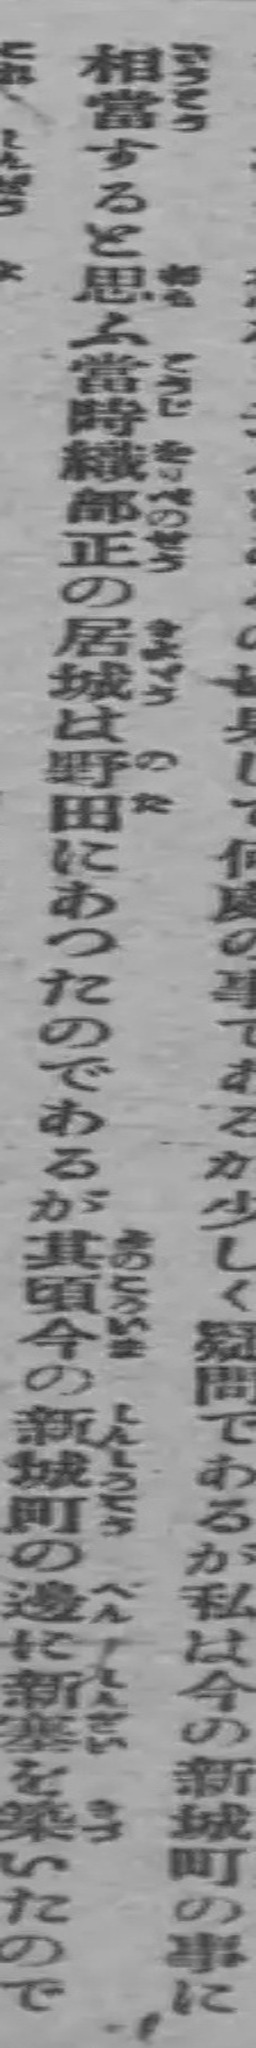織部新城相当すると思ふ当時織部正の居城は野田にあつたのであるが其頃今の新城町の辺に新塞を築いたので
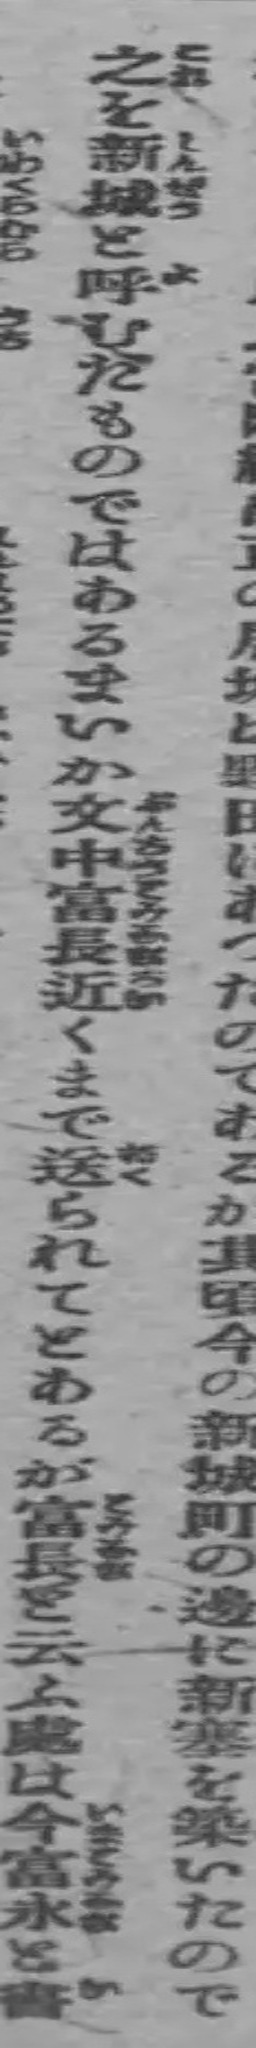之を新城と呼むだものではあるまいか文中富長近くまで送られてとあるが富長と云ふ処は今富永と書
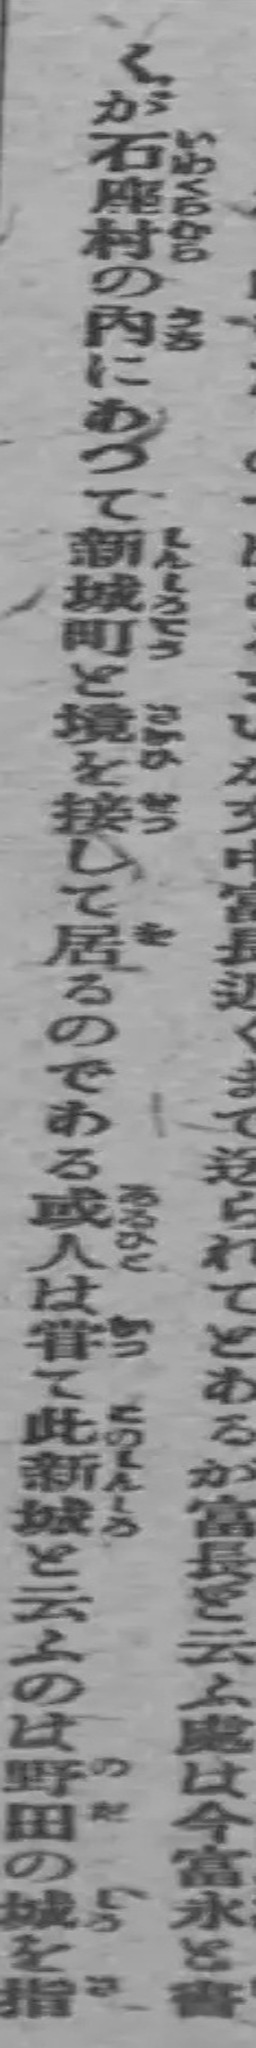くが岩座村の内にあつて新城町と境を接して居るのである或人は嘗て此新城と云ふのは野田の城を指
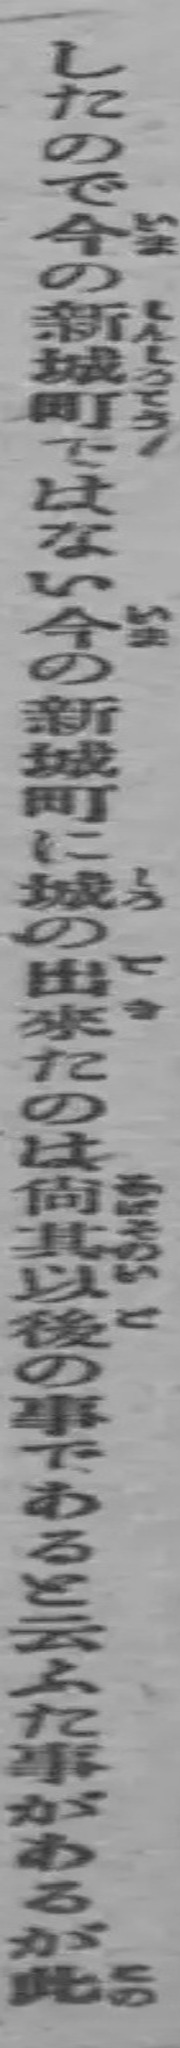したので今の新城町ではない今の新城町に城の出来たのは尚其以後の事であると云ふた事があるが此
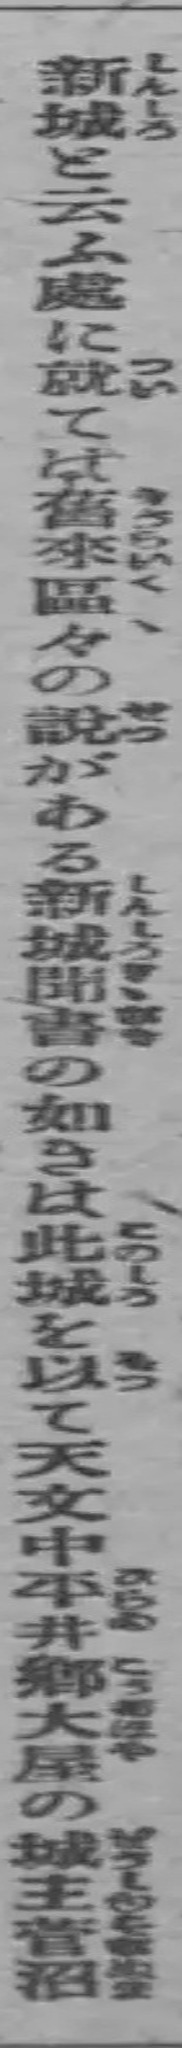新城と云ふ処に就ては旧来区々の説があるが新城聞書の如きは此城を以て天文中平井郷大屋の城主菅沼
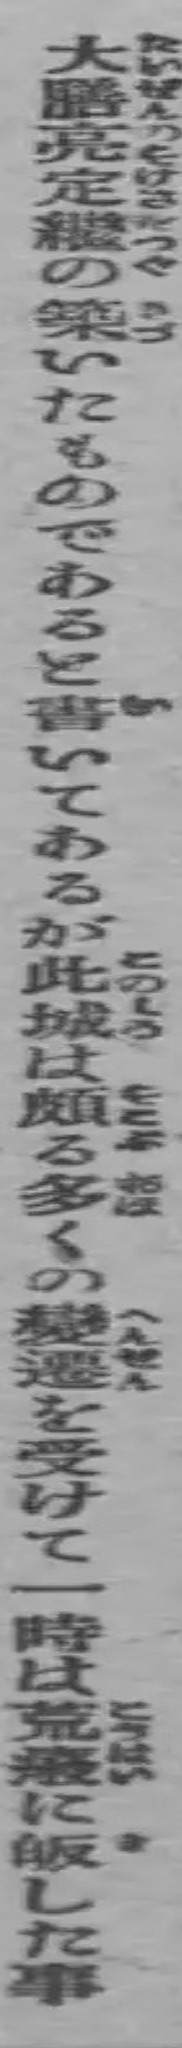大膳亮定継の築いたものであると書いてあるが此城は頗る多くの変遷を受けて一時は荒廃に皈した事
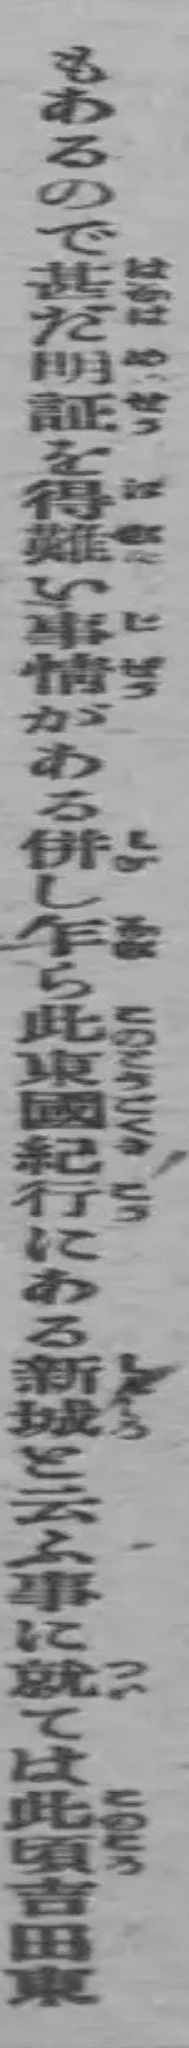もあるので甚だ明証を得難い事情がある併し乍ら此東国紀行にある新城と云ふ事に就ては此頃吉田東
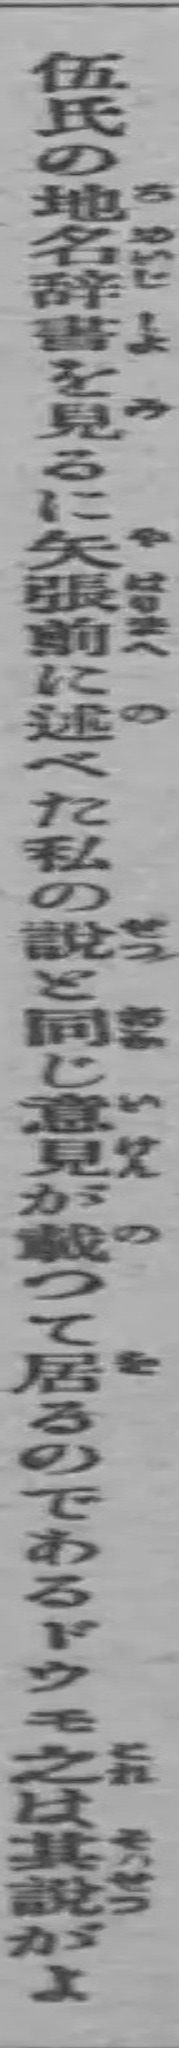伍氏の地名辞書を見るに矢張前に述べた私の説と同じ意見が載つて居るのであるドウモ之は其説がよ
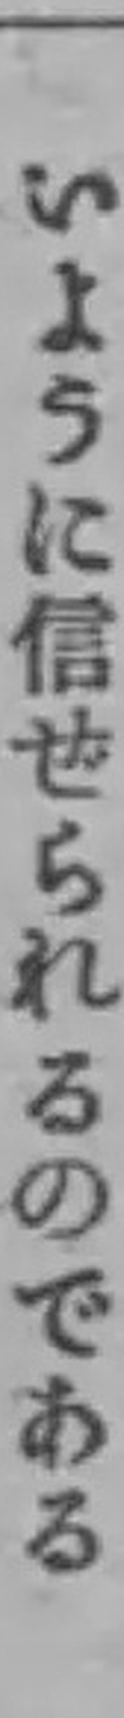いように信ぜられるのである
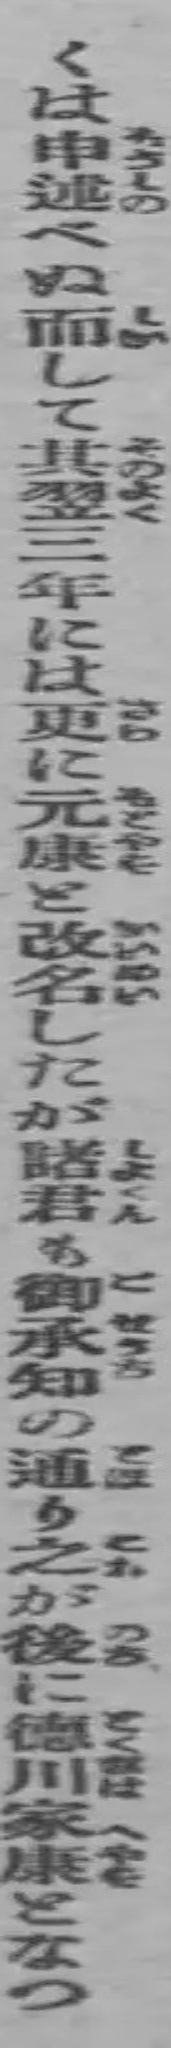徳川家康くは申述べぬ而して其翌三年には更に元康と改名したが諸君も御承知の通り之が後に徳川家康となつ
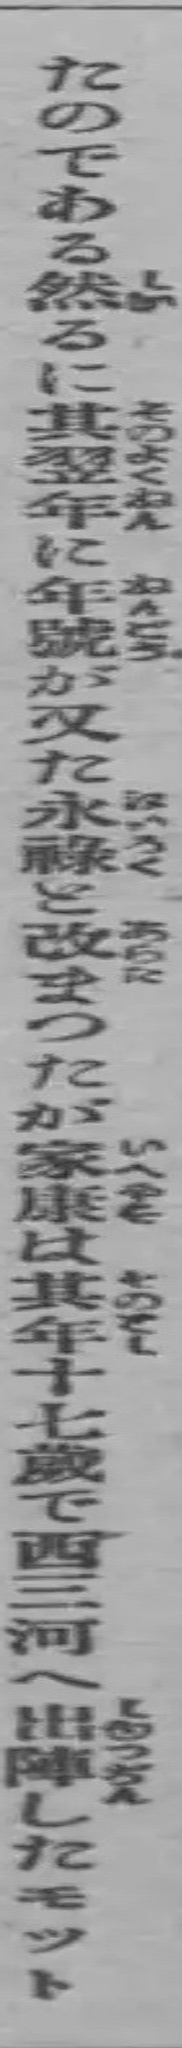たのである然るに其翌年に年号が又た永禄と改まつたが家康は其年十七歳で西三河へ出陣したモツト
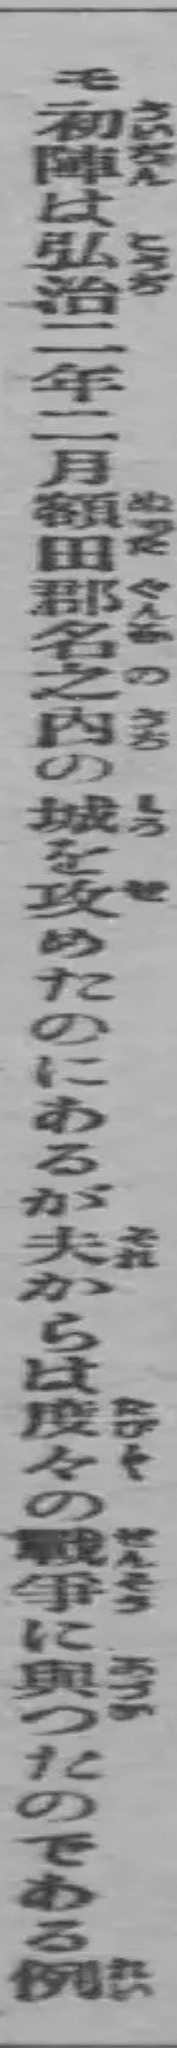モ初陣は弘治二年二月額田郡名之内の城を攻めたのにあるが夫からは度々の戦争に与つたのである例
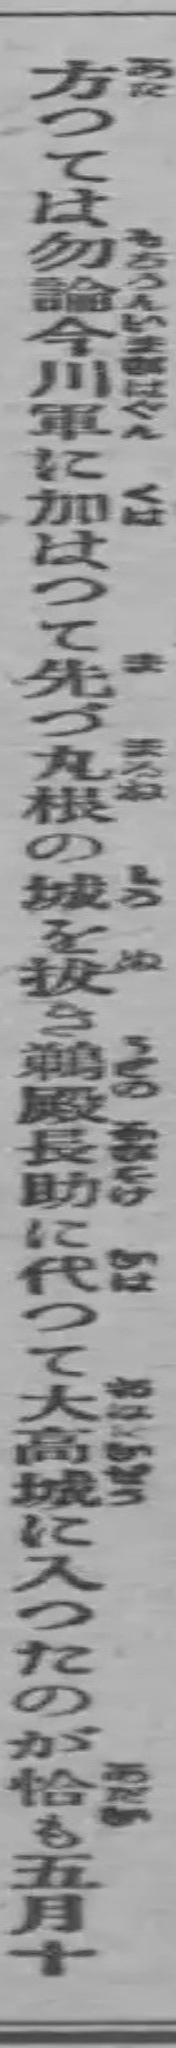方つては勿論今川軍に加はつて先づ丸根の城を抜き鵜殿長助に代つて大高城に入つたのが恰も五月十
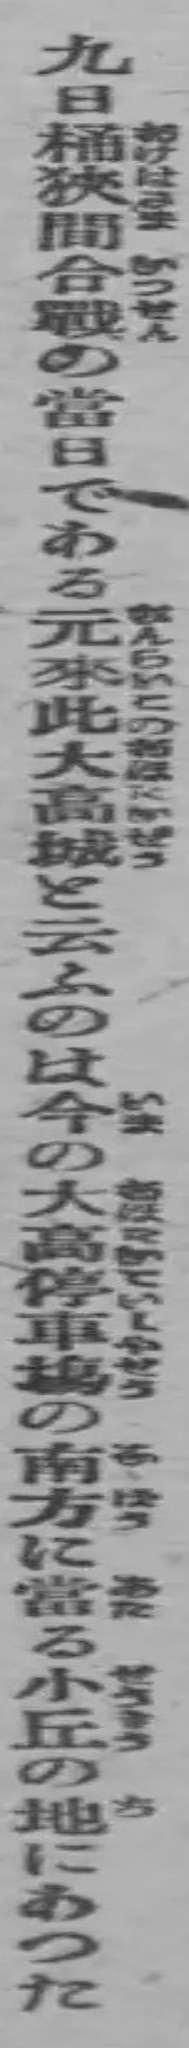桶狭間役九日桶狭間合戦の当日である元来此大高城と云ふのは今の大高停車場の南方に当る小丘の地にあつた
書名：豊橋市史談
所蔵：国立国会図書館 National Diet Library, JAPAN
